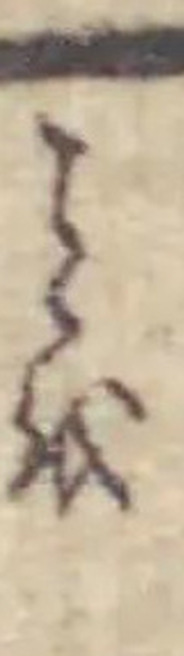ことを
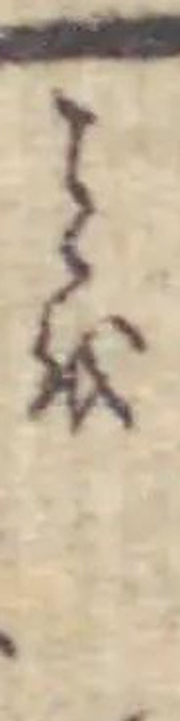ことを
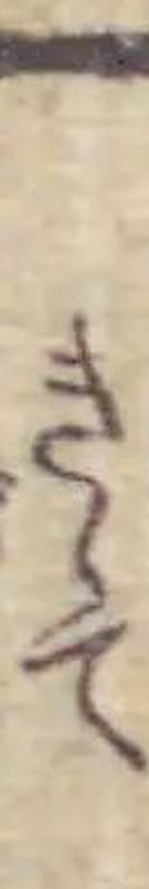きゝて
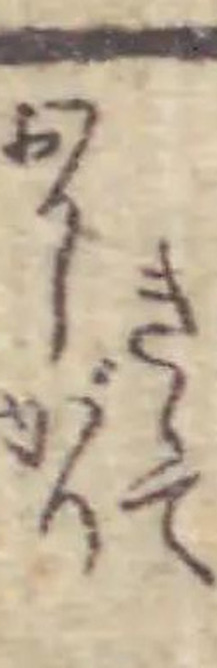おかしがり
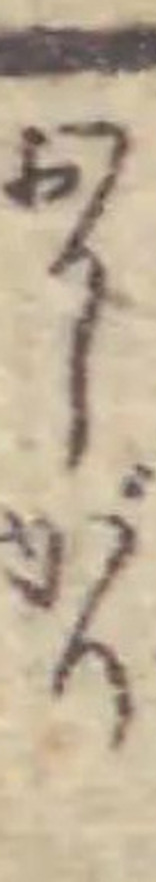おかしがり
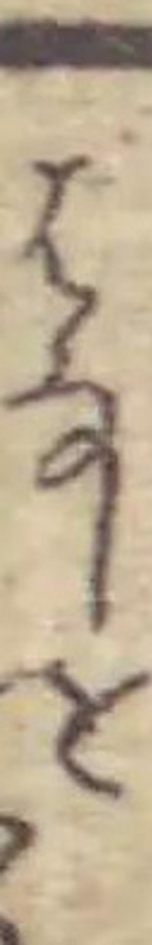はなしを
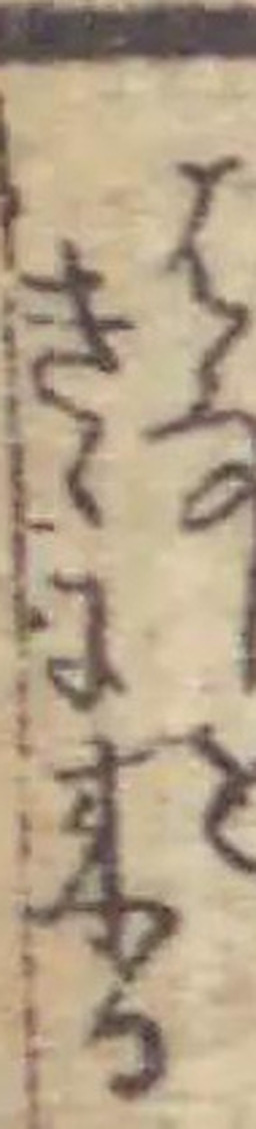きゝに来る

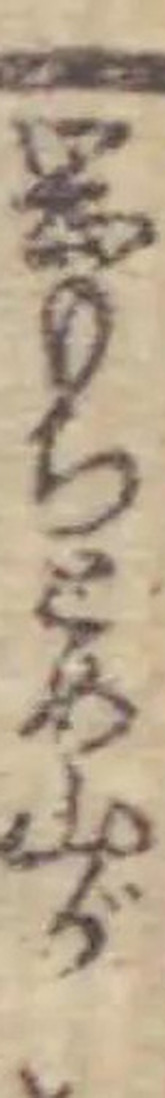岡もちとめ山が
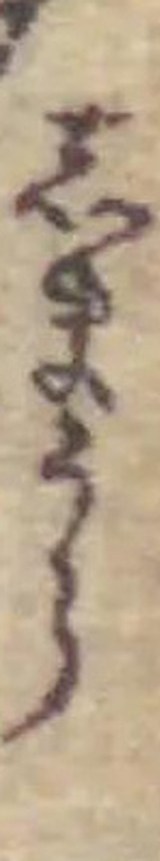しまうら
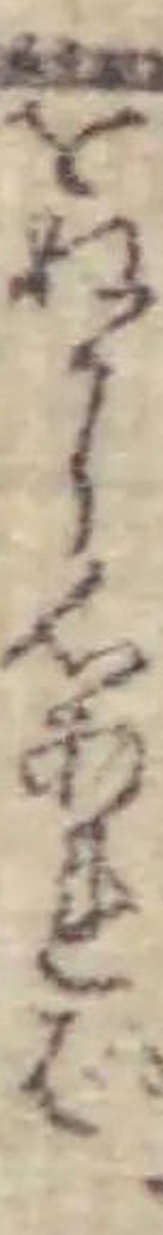をぬかし心あれば
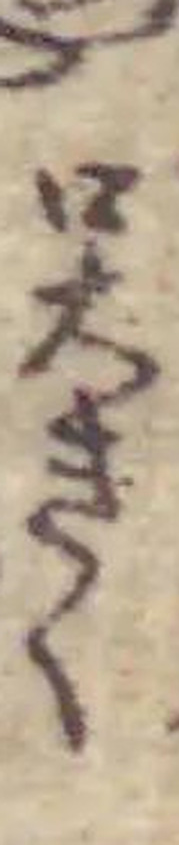口大きく
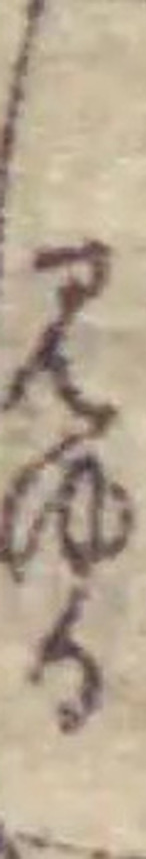見ゆる
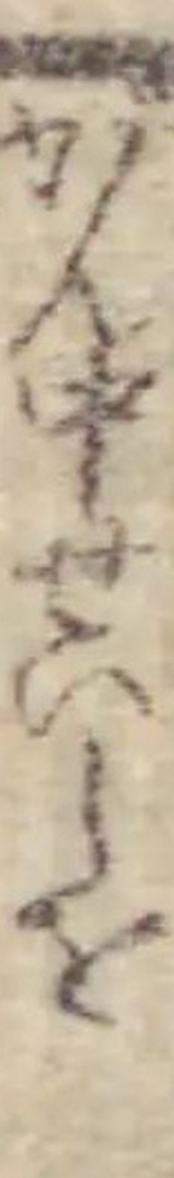がん中せいしを
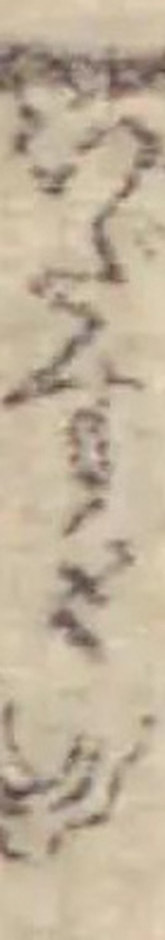いだすと
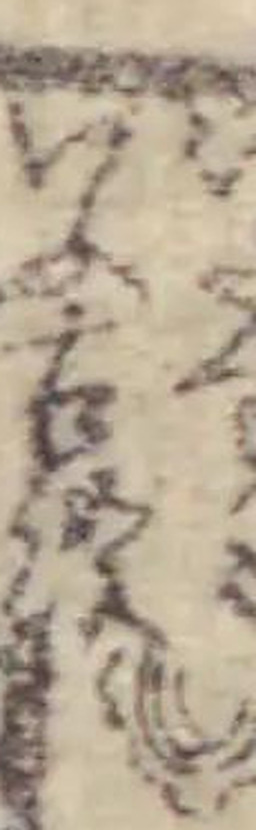いふ古語
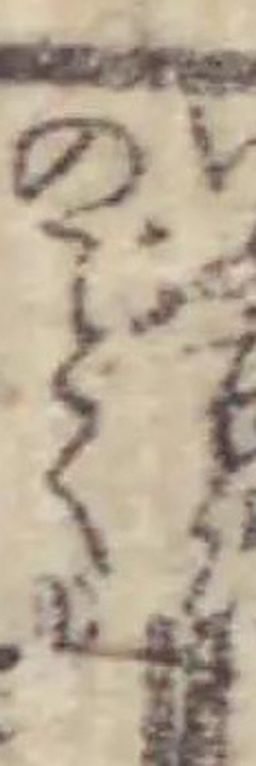のごとく
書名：亀山人家妖 3巻
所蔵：国立国会図書館 National Diet Library, JAPAN
